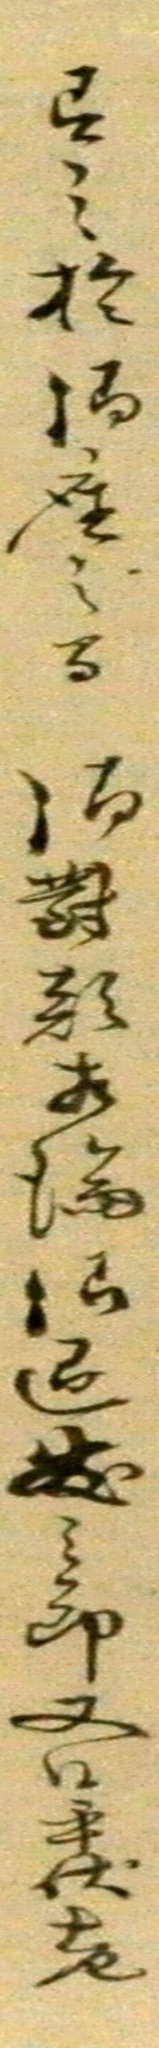有之於御座之間御対顔相済御退出之節又候平伏老
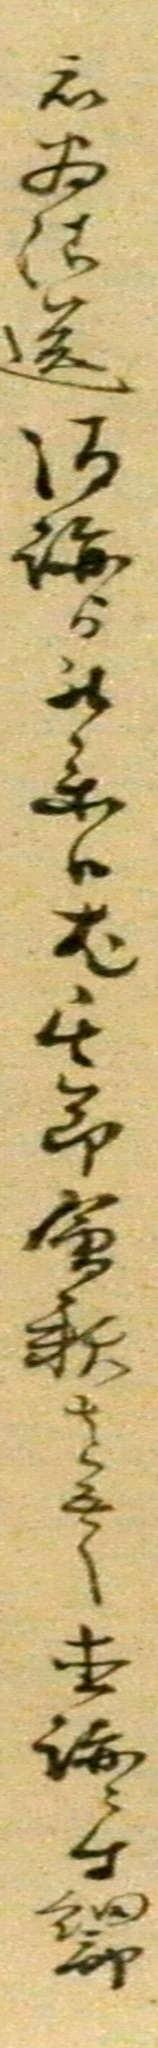衆為御送御跡ゟ被参候尤其節会釈は無之直跡ニ付細廊
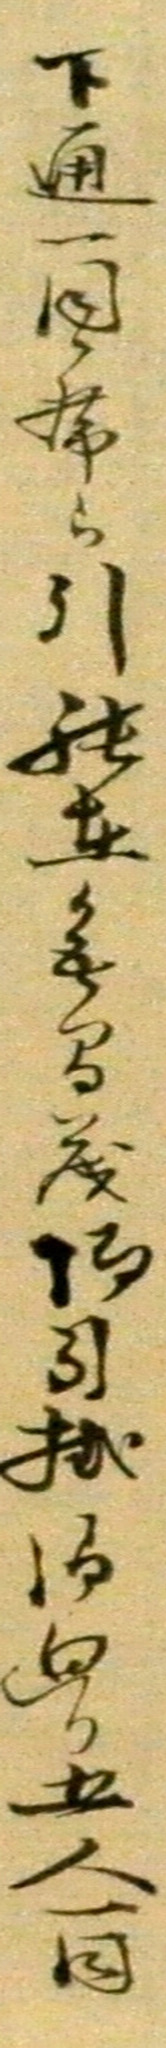下通一同席え引罷在無間も御引掛御廻り五人一同
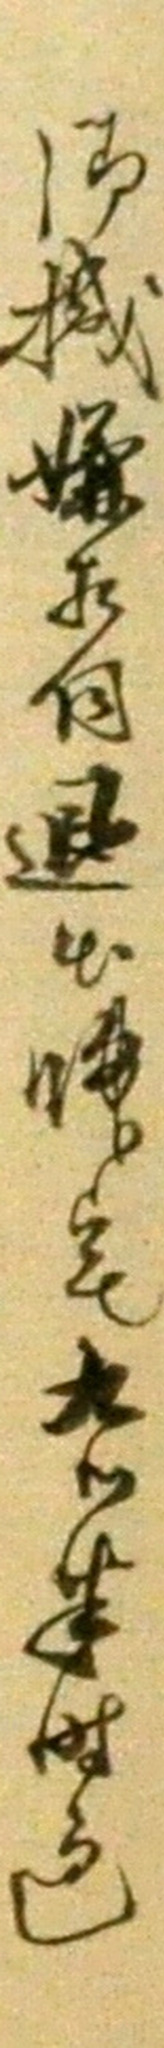御機嫌相伺退出帰宅九ツ半時過
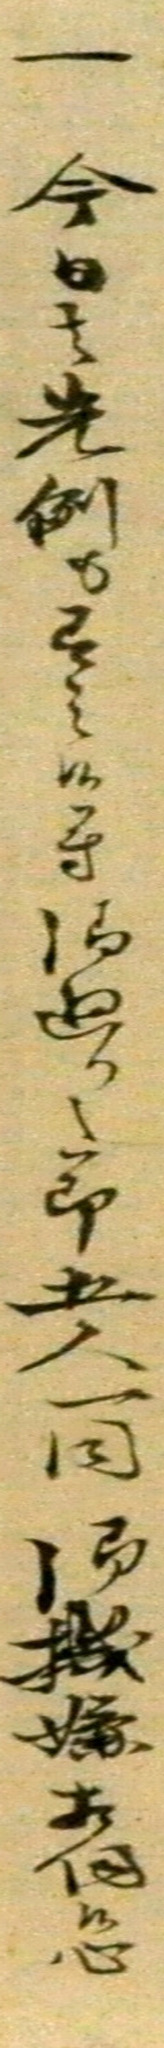一今日は先例も有之候ニ付御廻り之節五人一同御機嫌相伺候心
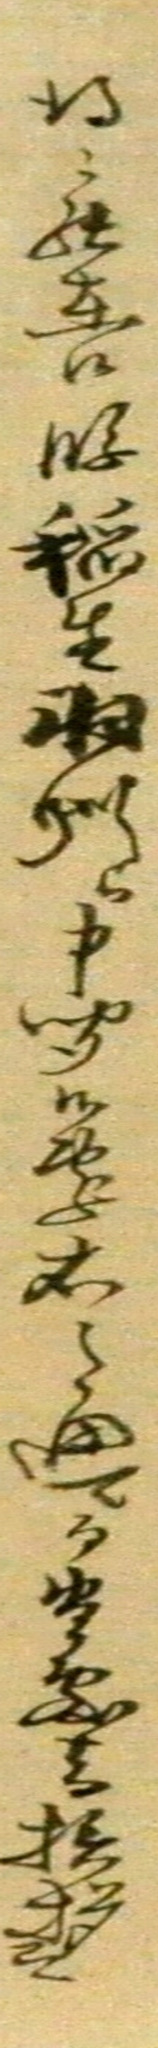得ニ罷在候段稲生羽州ゟ申聞候処右之通ニ而宜敷旨挨拶有
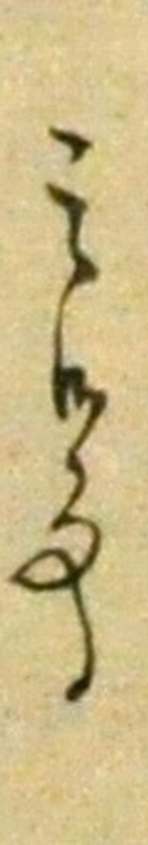之候事

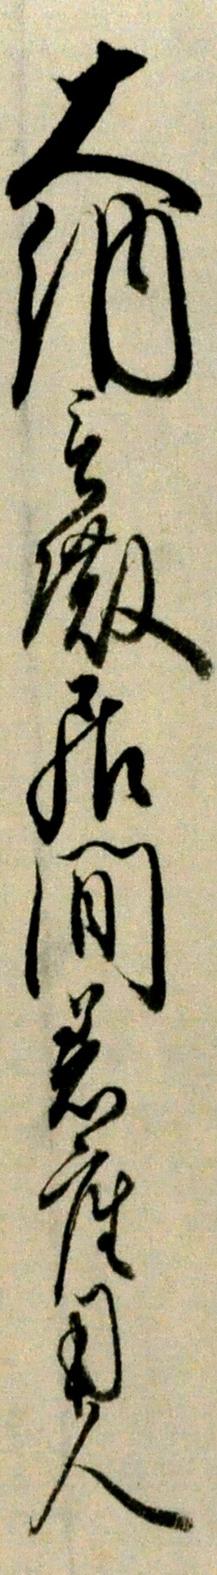大納言殿居間着座用人
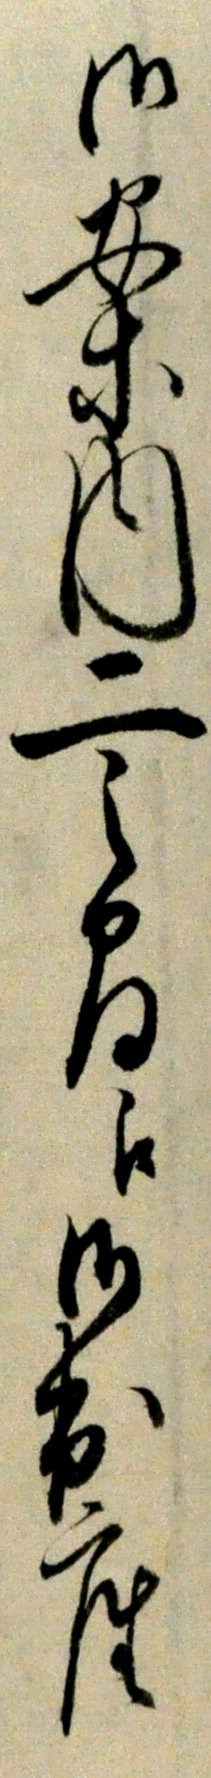御案内二之間え御出座
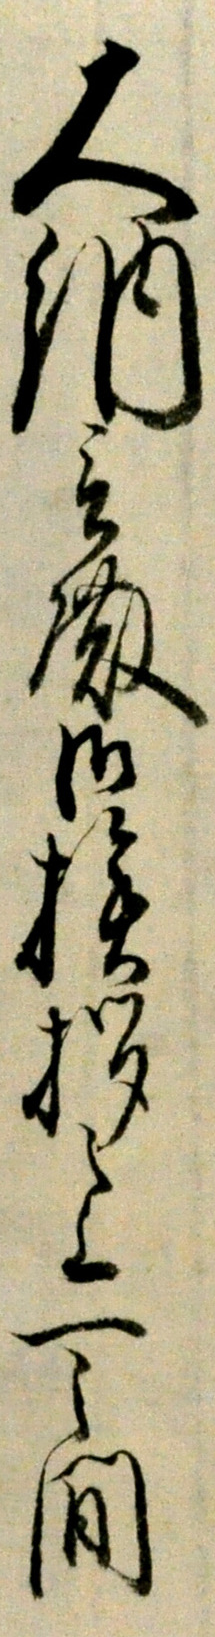大納言殿御挨拶之二之間
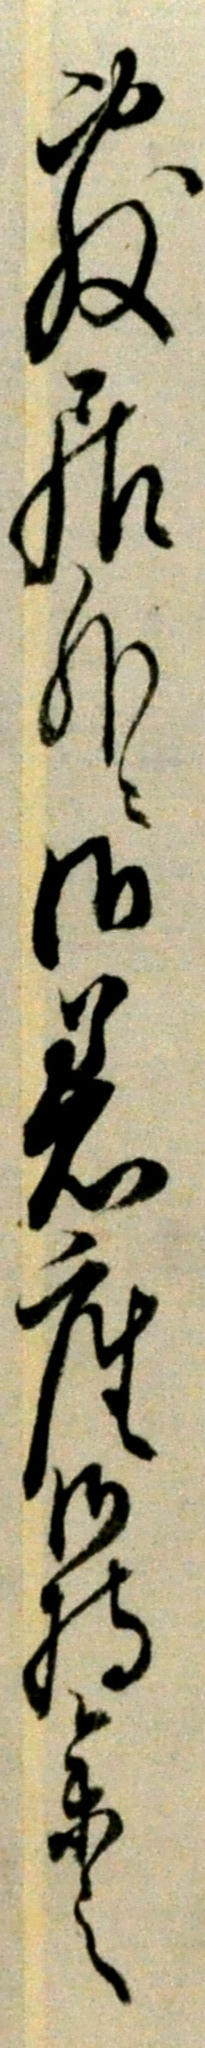敷居外ニ御着座御持参之
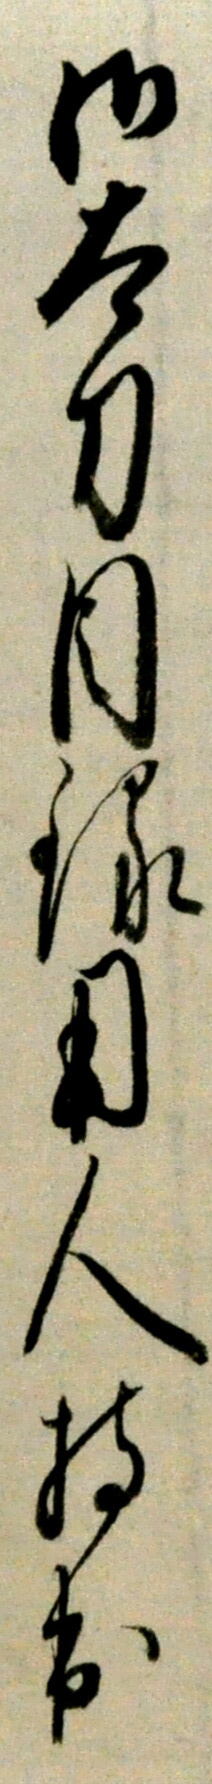御太刀目録用人持出

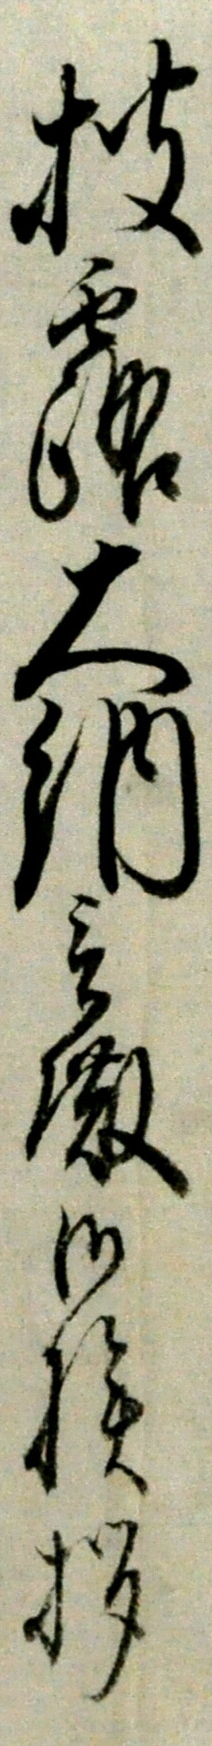披露大納言殿御挨拶
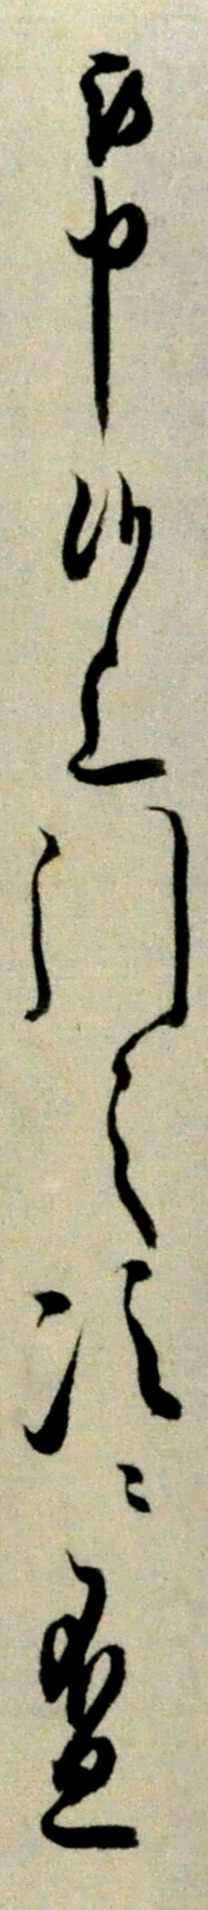被申候上引之次ニ盃
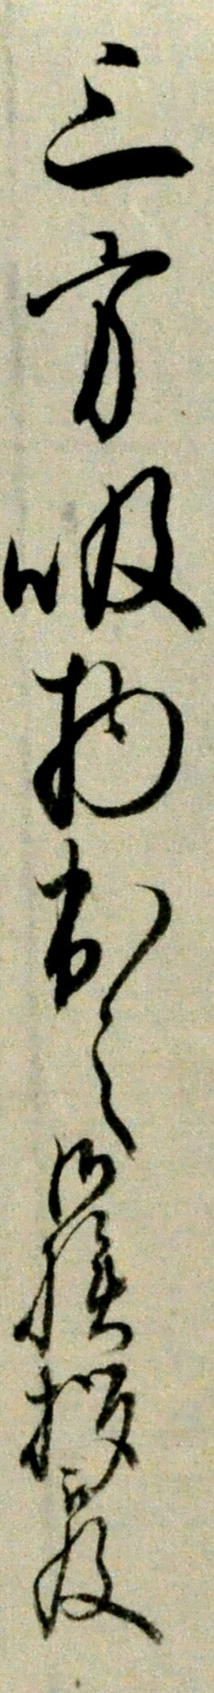三方吸物出之御挨拶被及
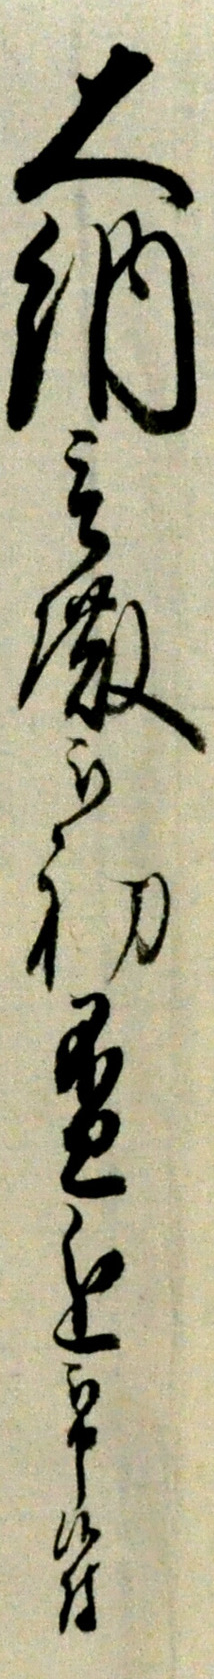大納言殿え初盃進被申候付
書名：諸留書〔一括〕
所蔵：伊那市立高遠町図書館・合同会社AMANE
